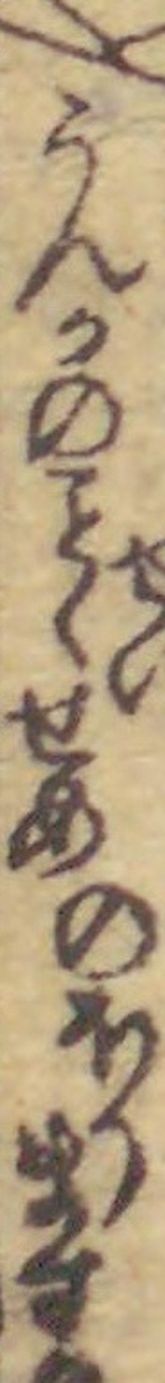うんかのことくせめのほりまする

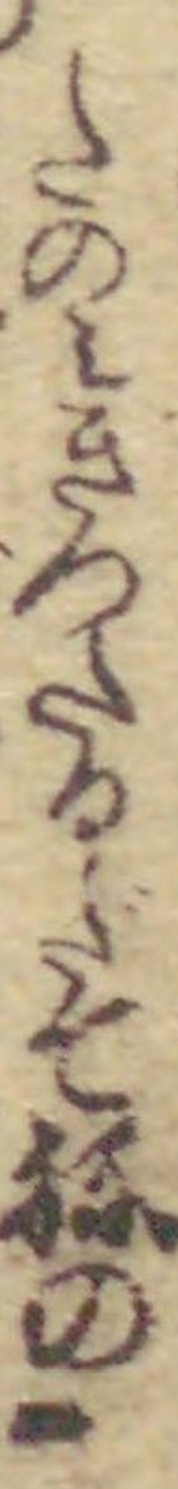たのみきつたるだてねの
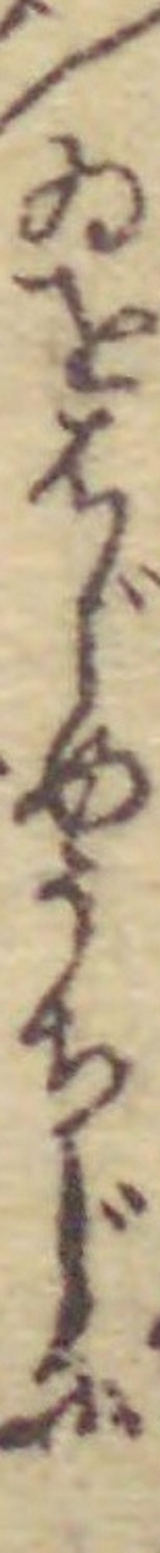ゐをはじめうちじに
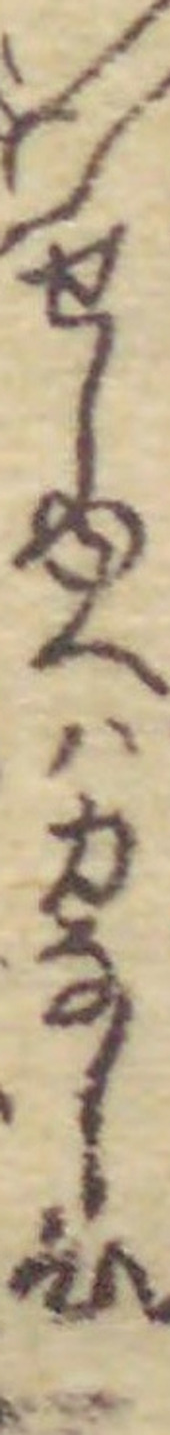せしゆへはかなし心
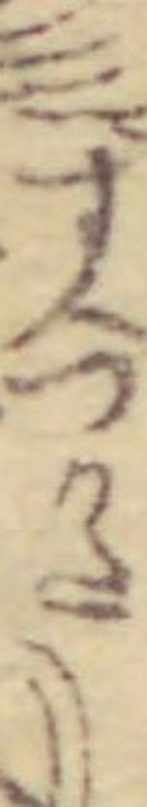すへつかた
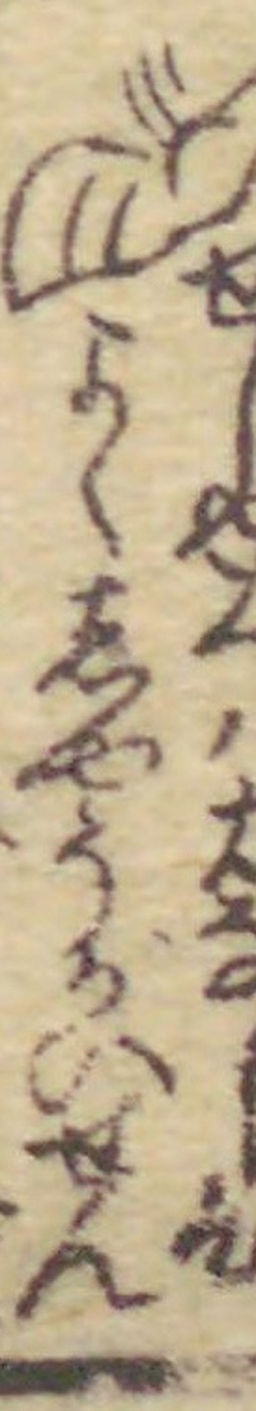よくしやうがいせん
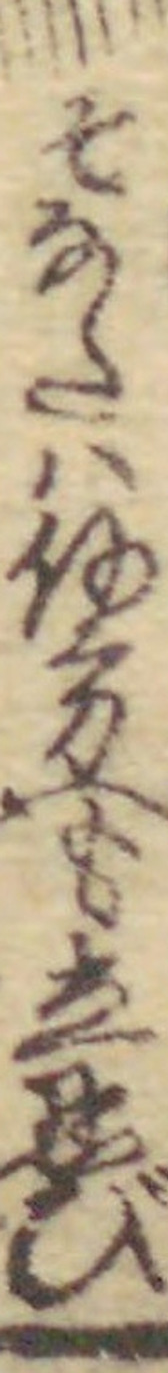そなたは出方へも立忍び
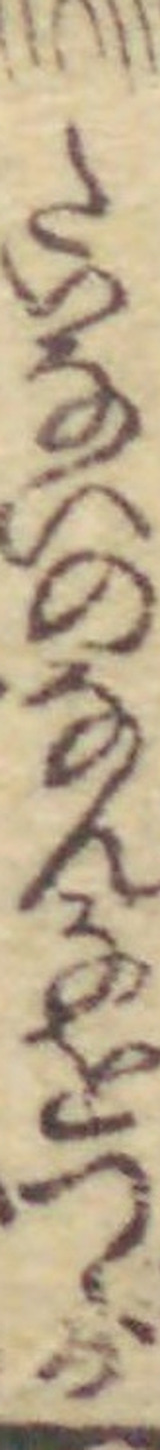たいないのなん子をつゝが
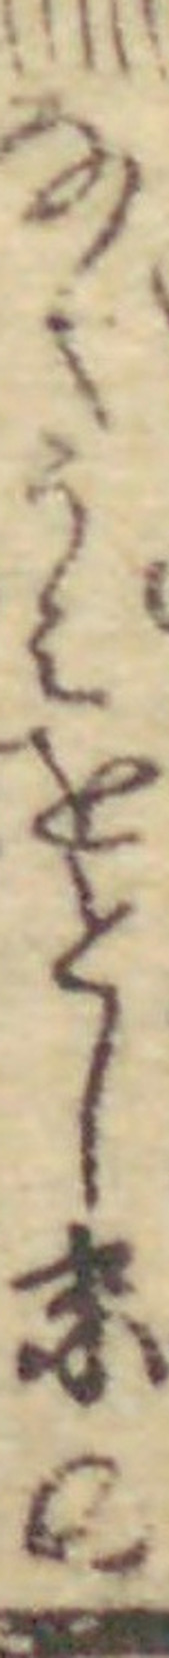なくうみをとし末の
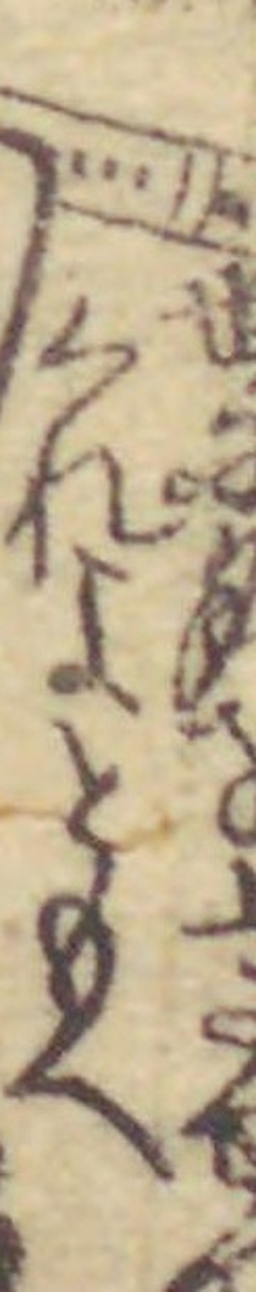くれよともへ
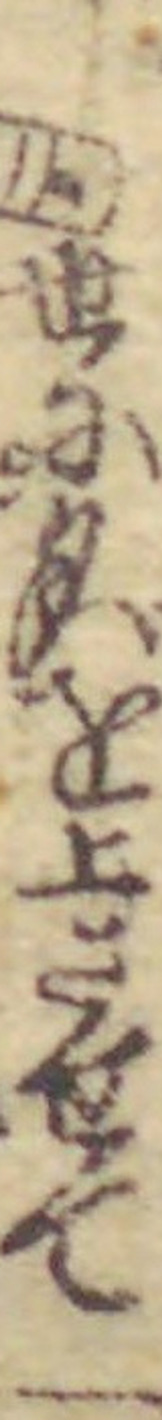世に名を上させて
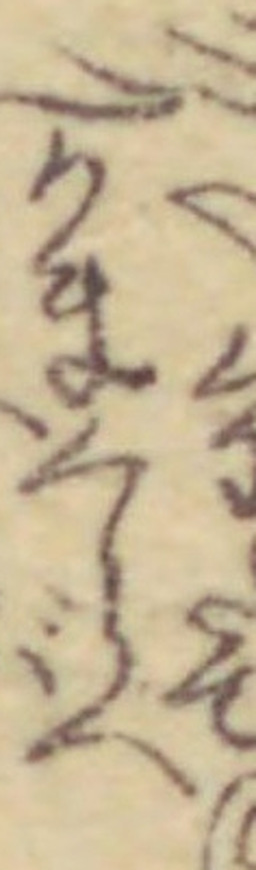かまくらへ
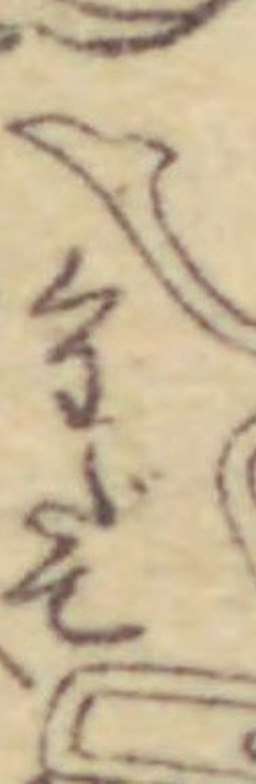くわだて
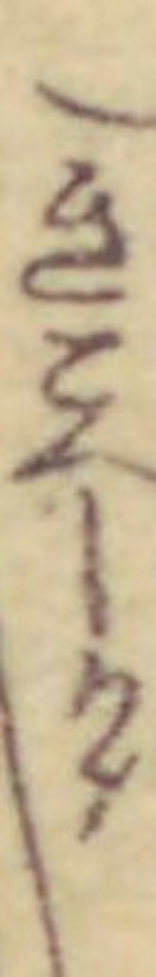きこへしかば
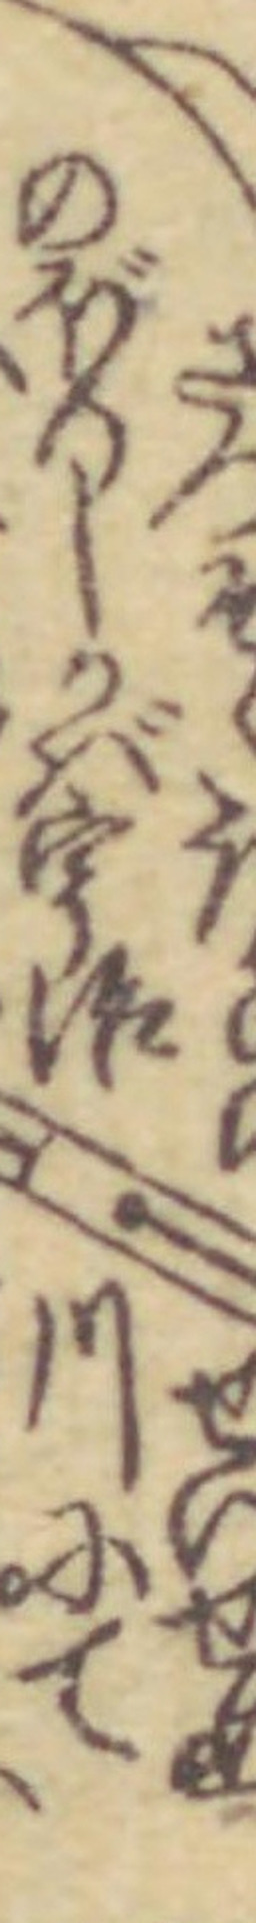のぼりしかば宇治川にて
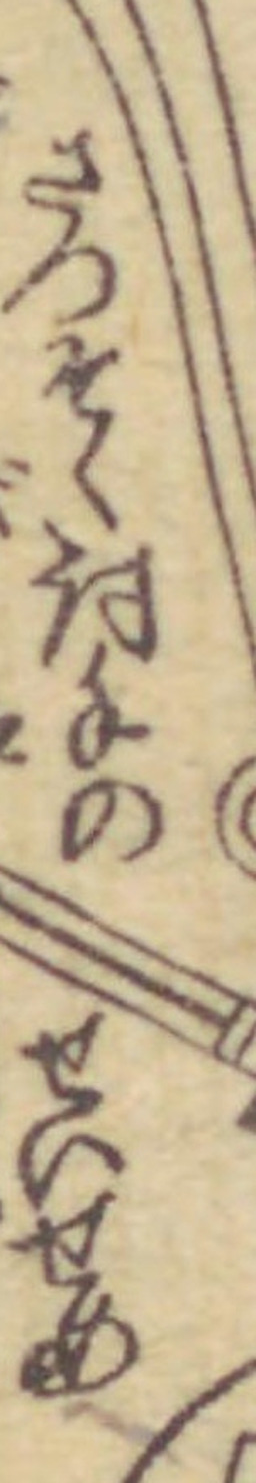さつそく討手のせいせめ
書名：朝比奈草摺実記 2巻
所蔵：国立国会図書館 National Diet Library, JAPAN
